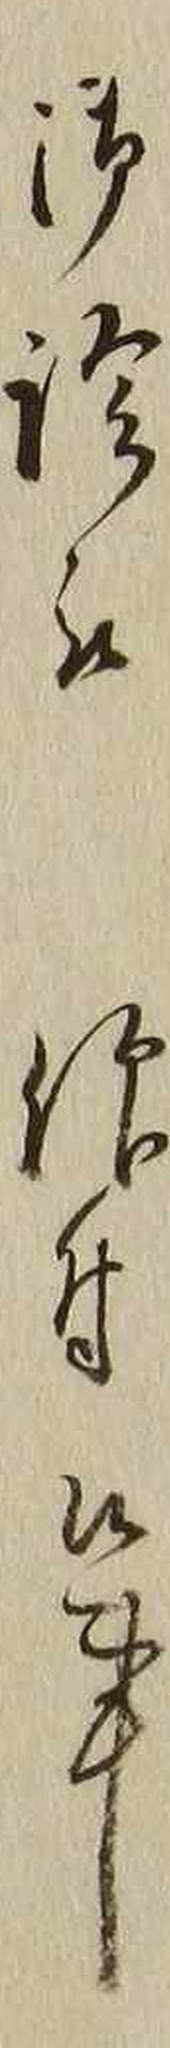御診被仰付候事
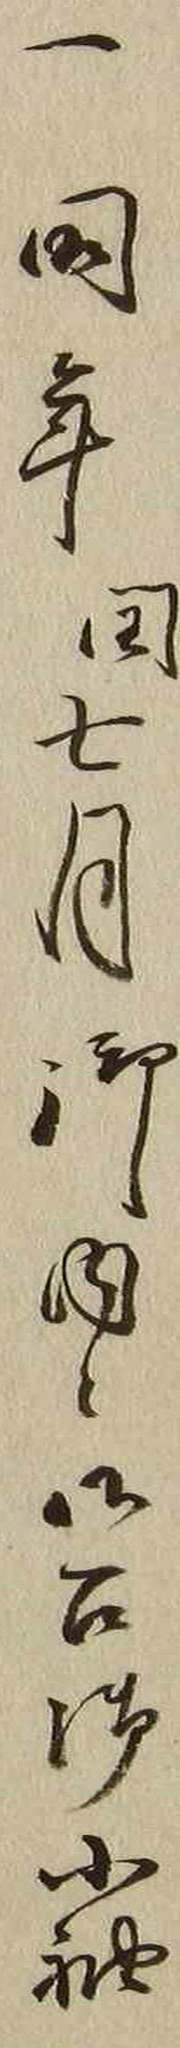一同年閏七月御内々御召御小袖
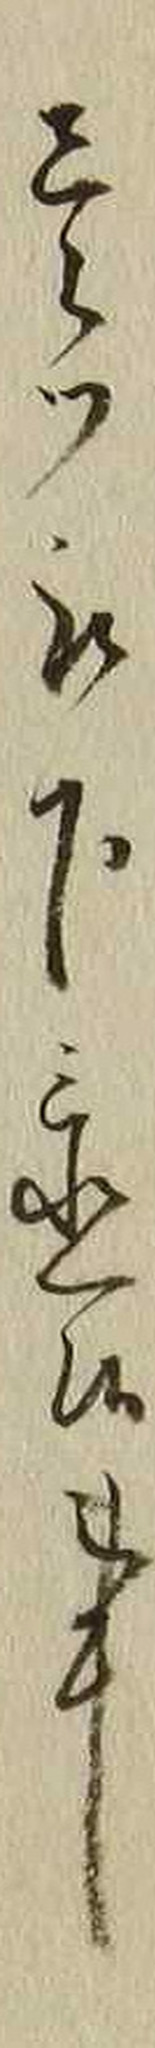壱ツ被下置候事
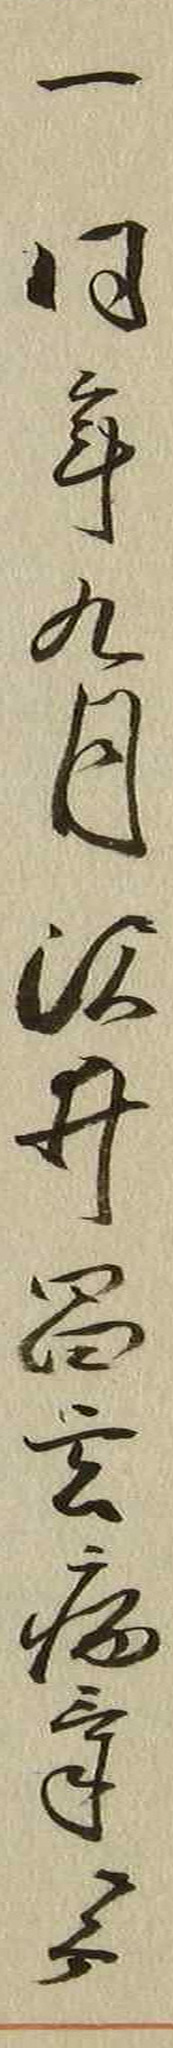一同年九月沢井昌玄病気ニ而
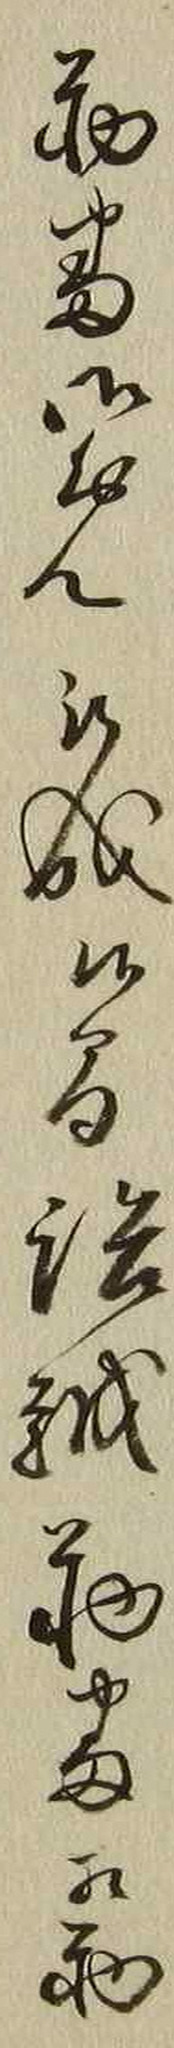勤番御免被成候間詰越勤番相勤
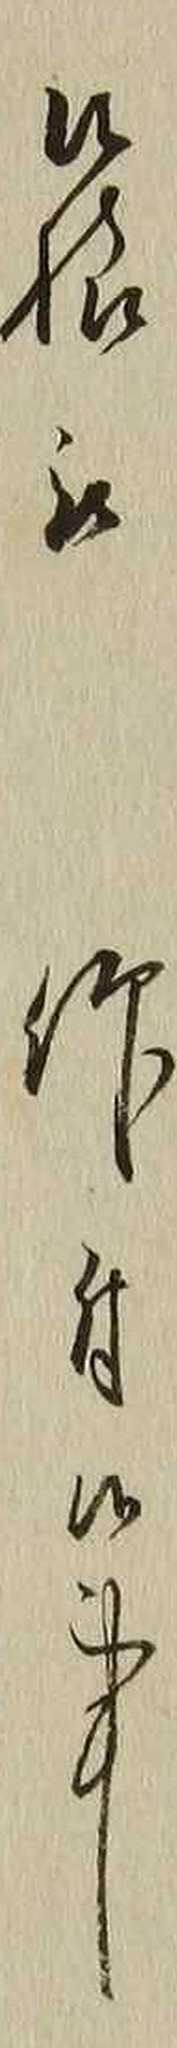候様被仰付候事
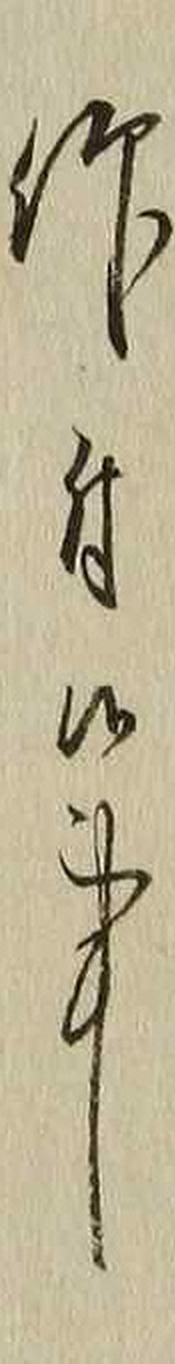仰付候事
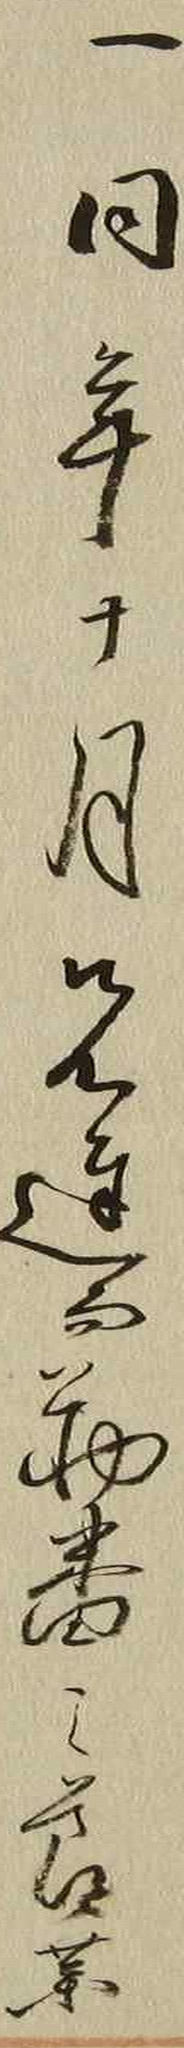一同年十月先達而勤番之節薬
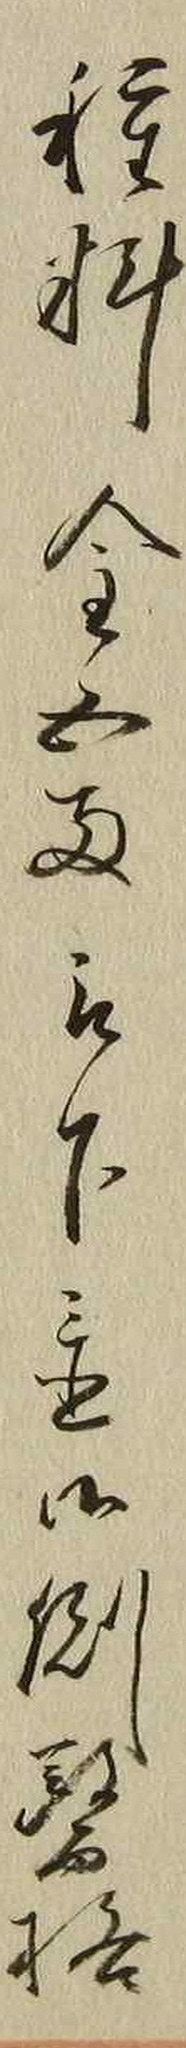種料金五両被下置御側医挌
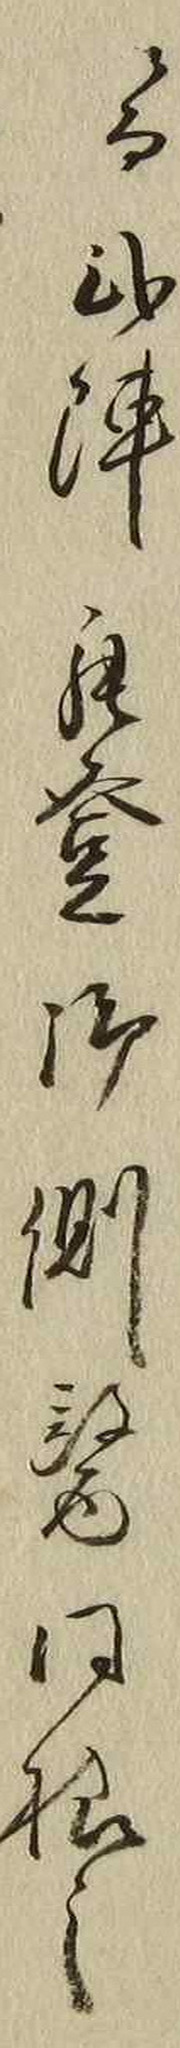ニ而弐陣罷登御側医同様之
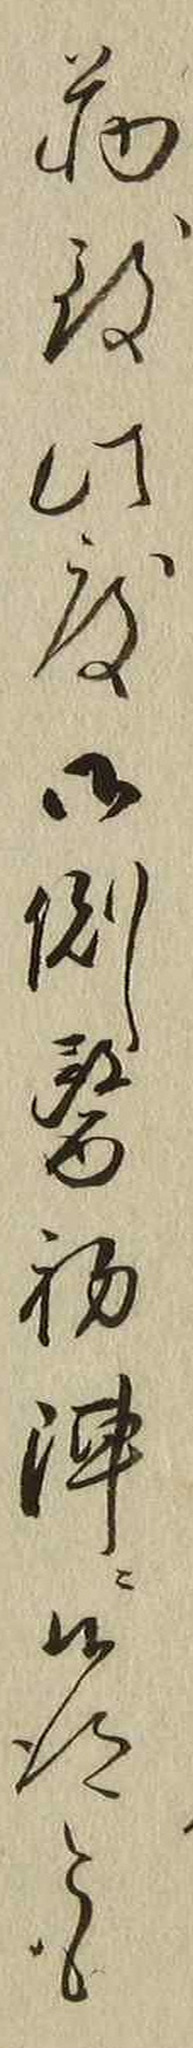勤致此度御側医初陣ニ候得とも
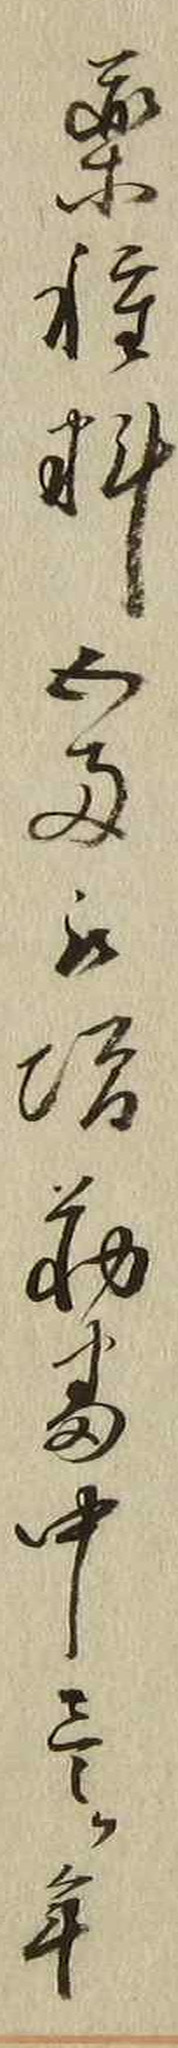薬種料五両被増勤番中壱ケ年
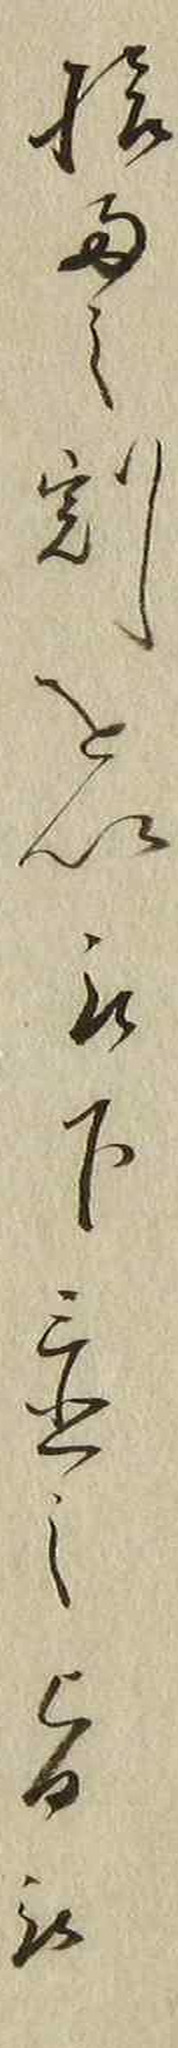拾料之割を以被下置之旨被
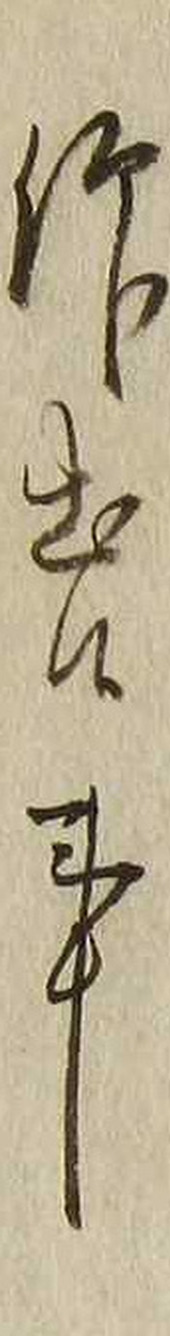仰出候事
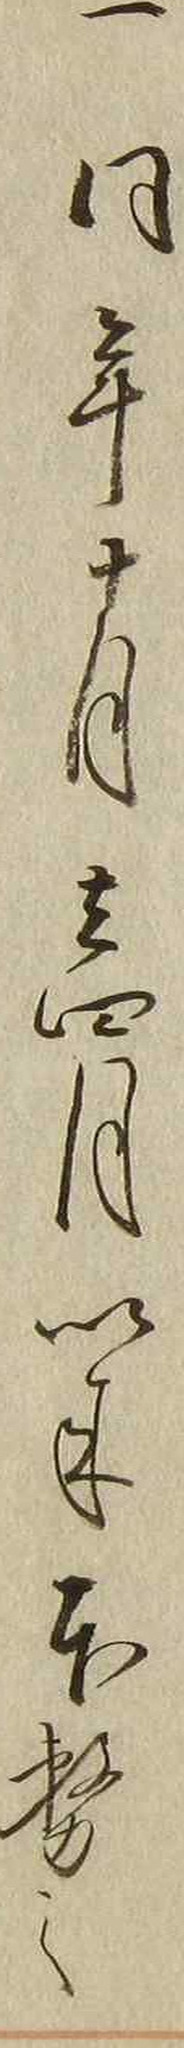一同年十月去四月以来本務之
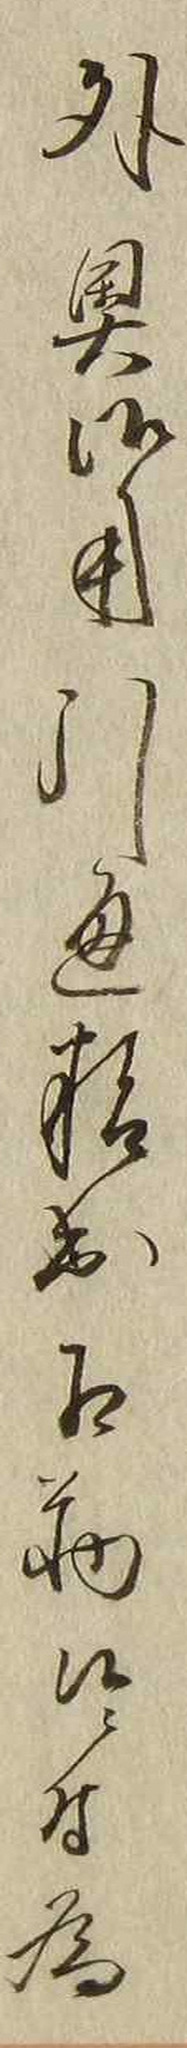外奥御用引通精出相勤候ニ付為
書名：諸士系譜　巻之68　を之部2
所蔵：会津若松市立会津図書館
